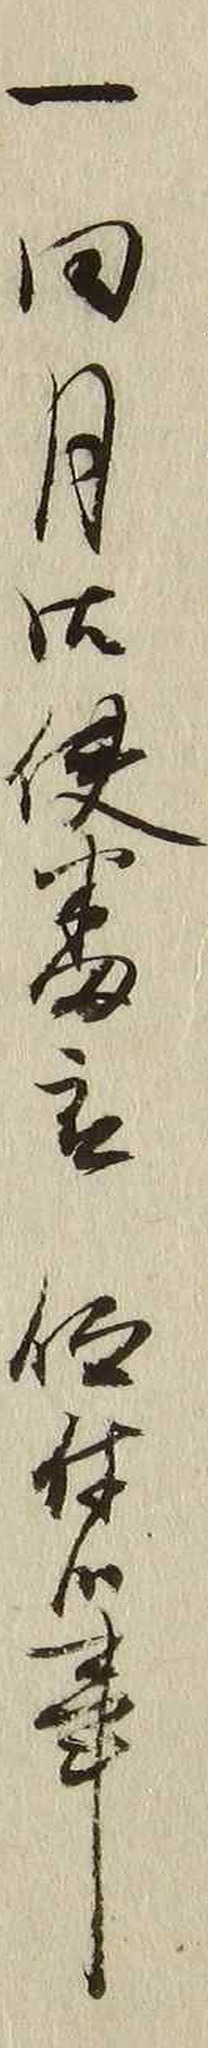一同月御使番被仰付候事
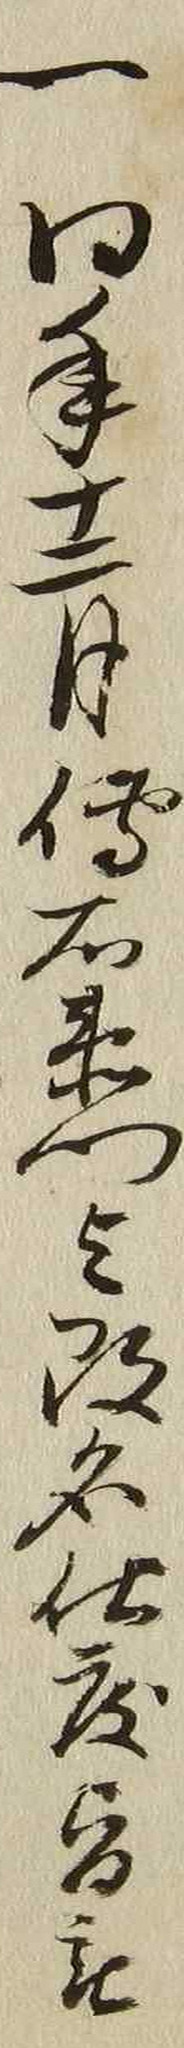一同年十二月伝右衛門与改名仕度旨被
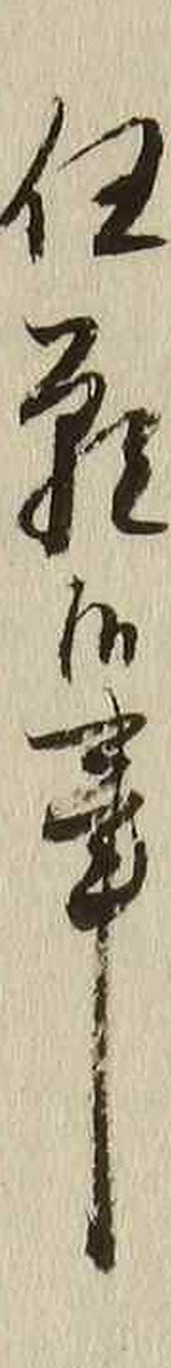任願候事
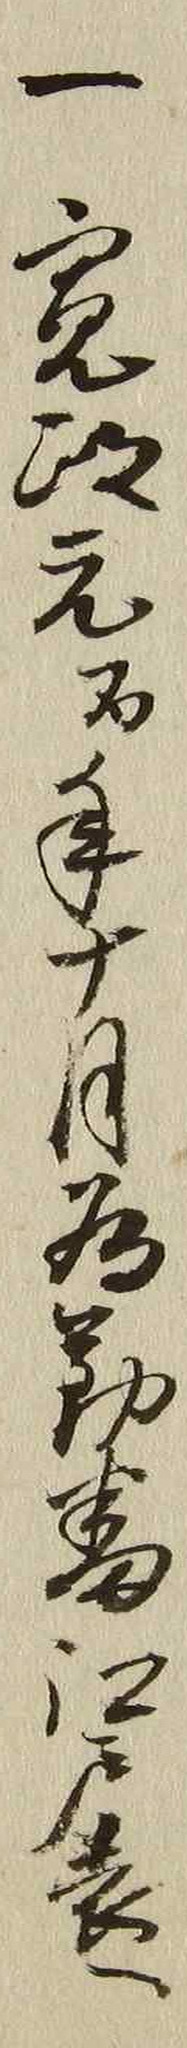一寛政元酉年十月為勤番江戸表へ
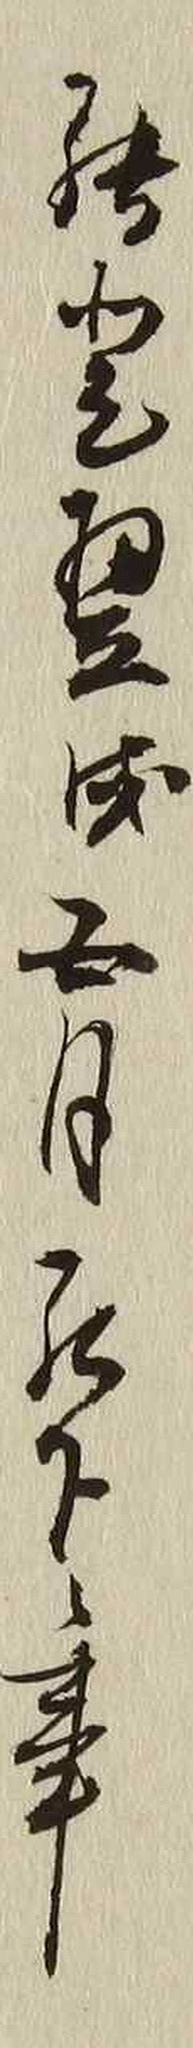罷登翌戌五月罷下候事
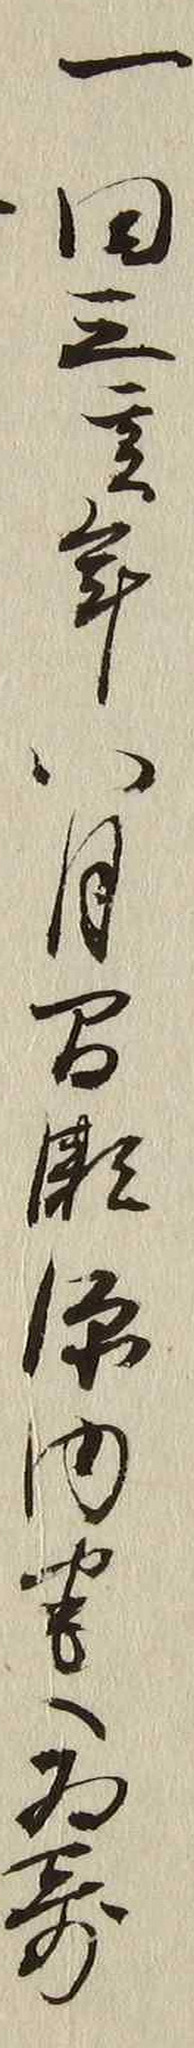一同三亥年八月間瀬源内宅へ為寄
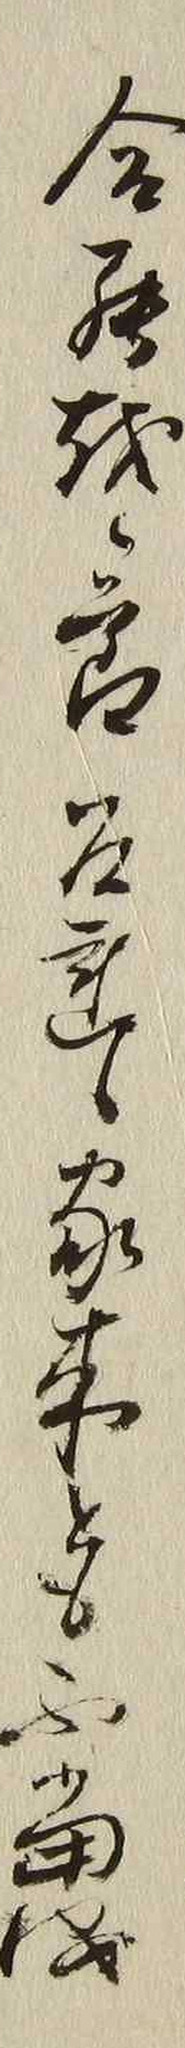合罷越候節召連候家来とも不当儀
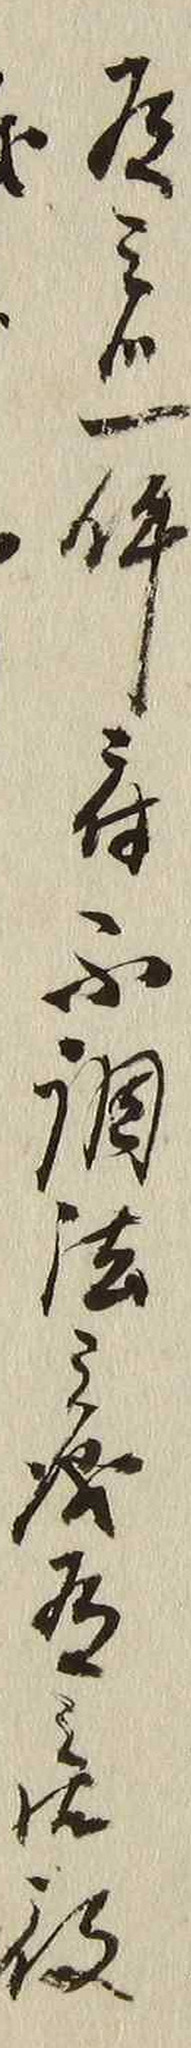有之候一件ニ付不調法之儀有之御役
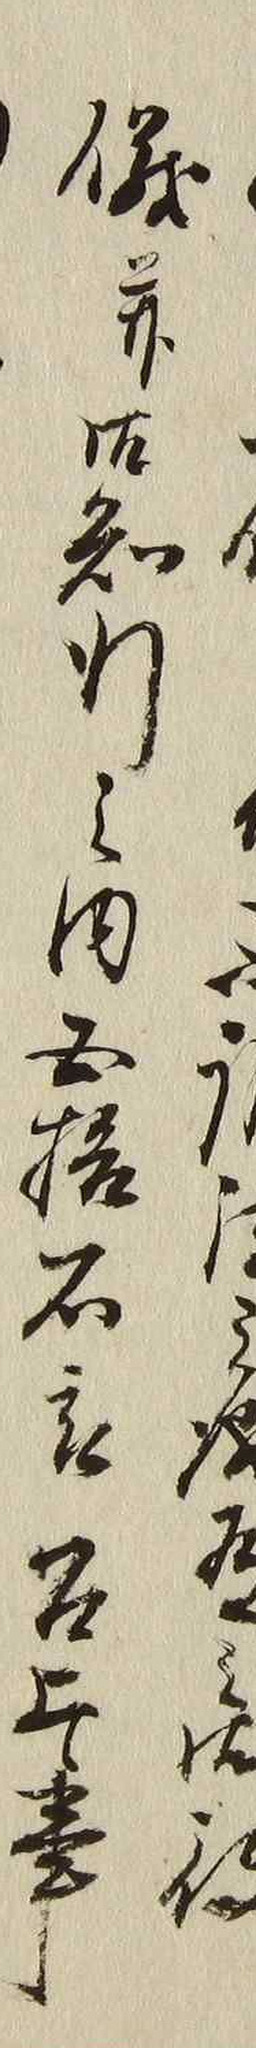儀并御知行之内五拾石被召上候事
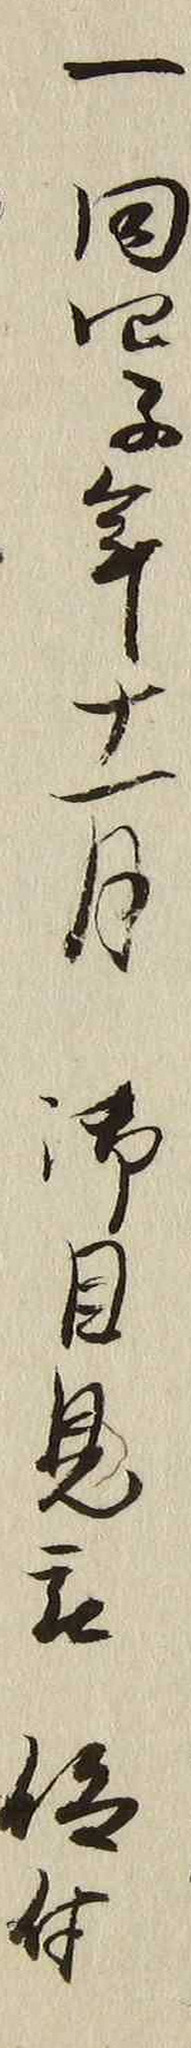一同四子年十一月御目見被仰付
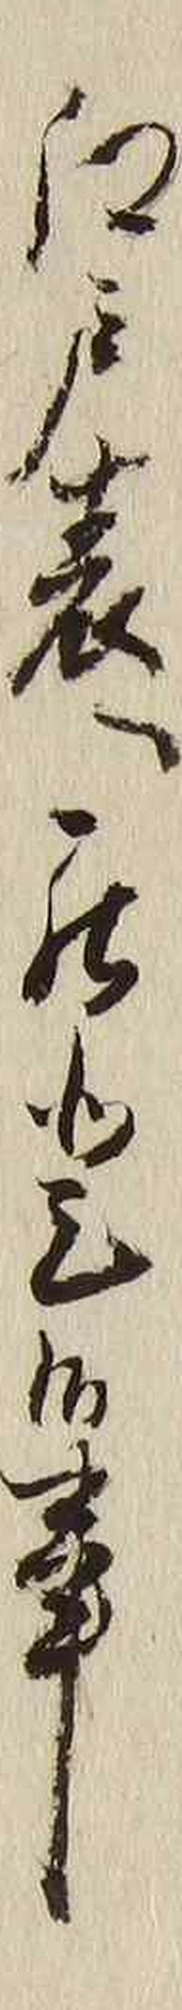江戸表へ罷登候事
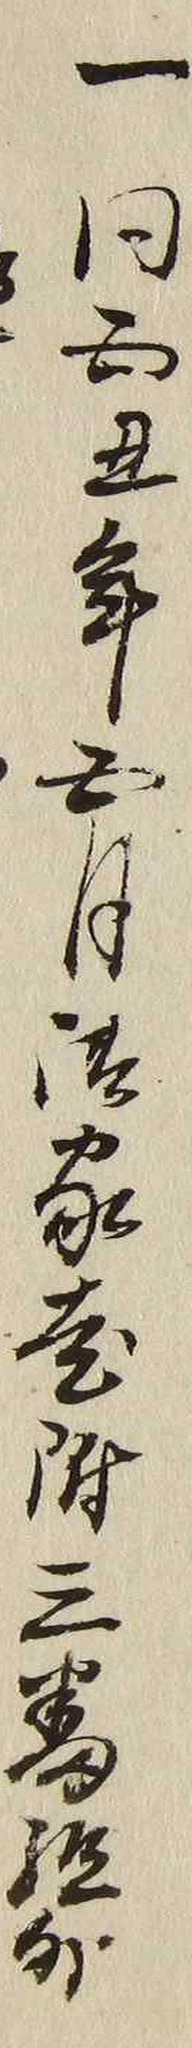一同五丑年五月御家老附三番組外
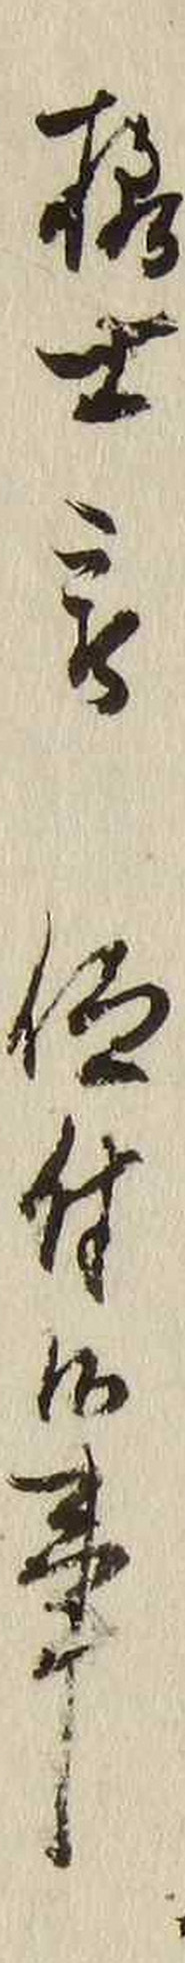様士被仰付候事
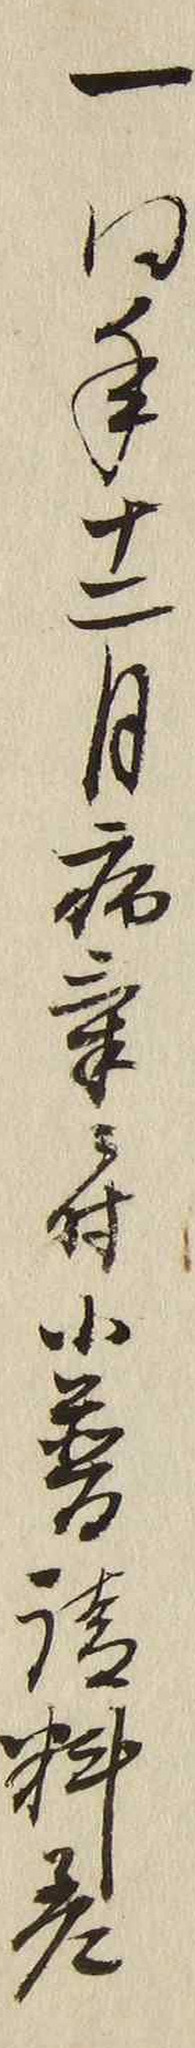一同年十二月病気ニ付小普請料差

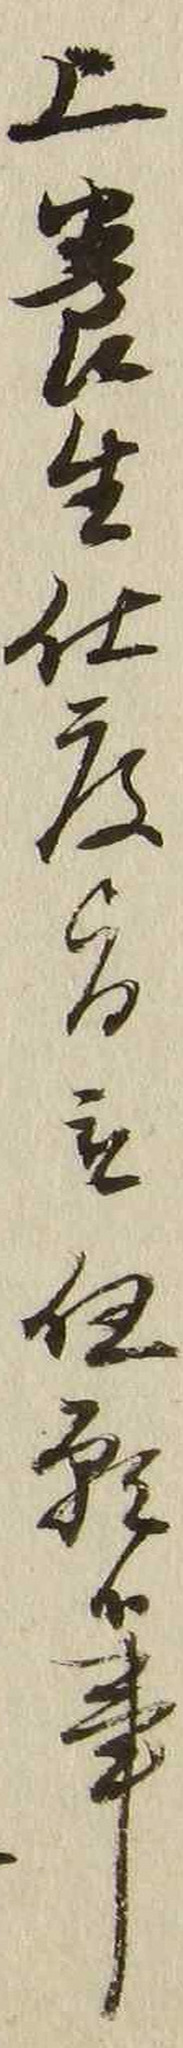上養生仕度旨被任願候事
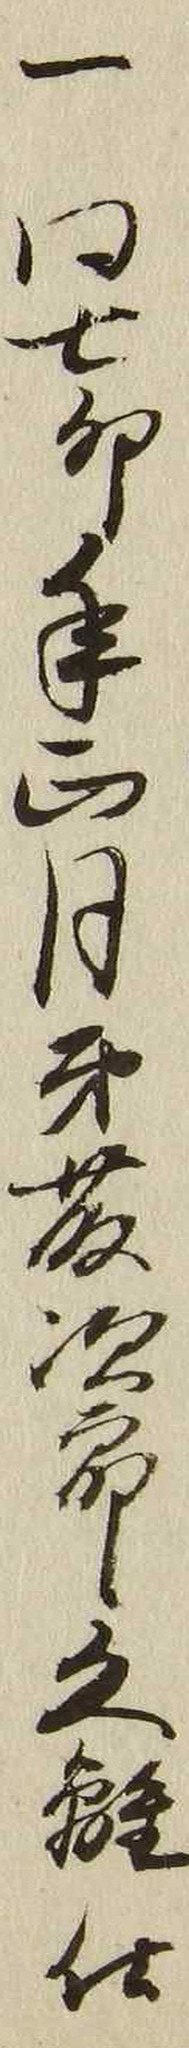一同七卯年正月弟藤次郎久離仕
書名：諸士系譜　巻之348　も之部4
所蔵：会津若松市立会津図書館
